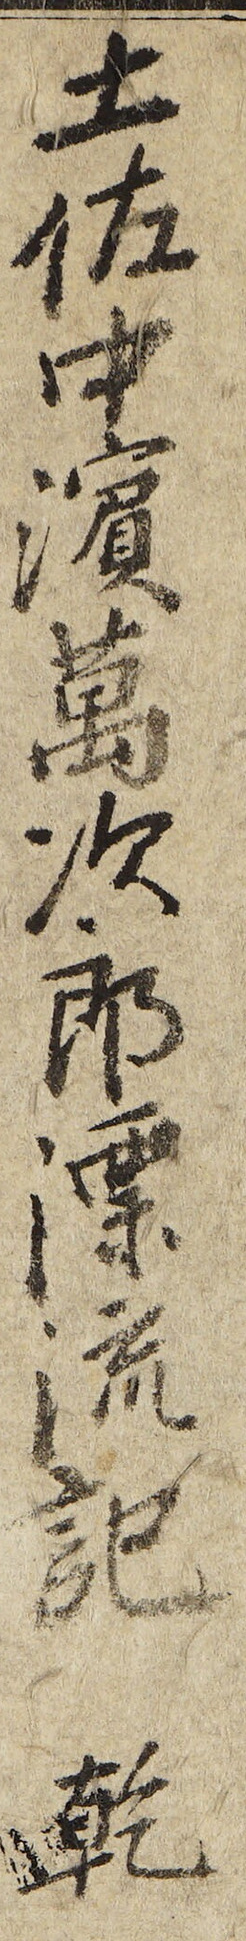土佐中浜万次郎漂流記乾

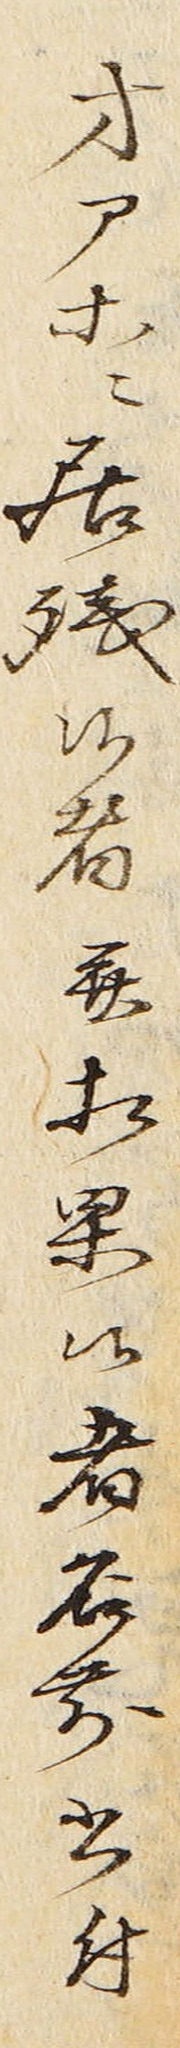オアホに居残候者并相果候者名前書付
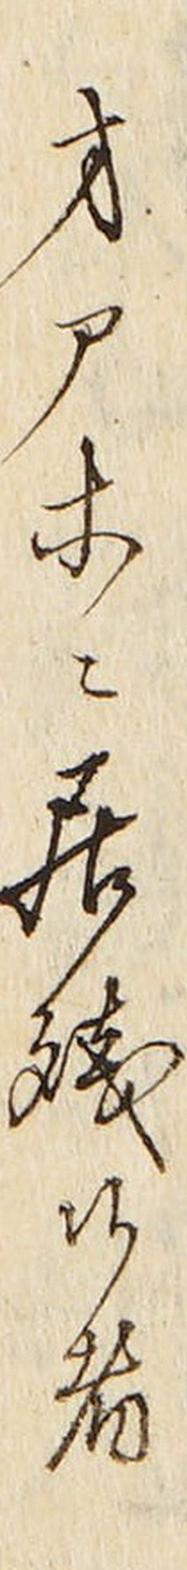オアホに居残候者
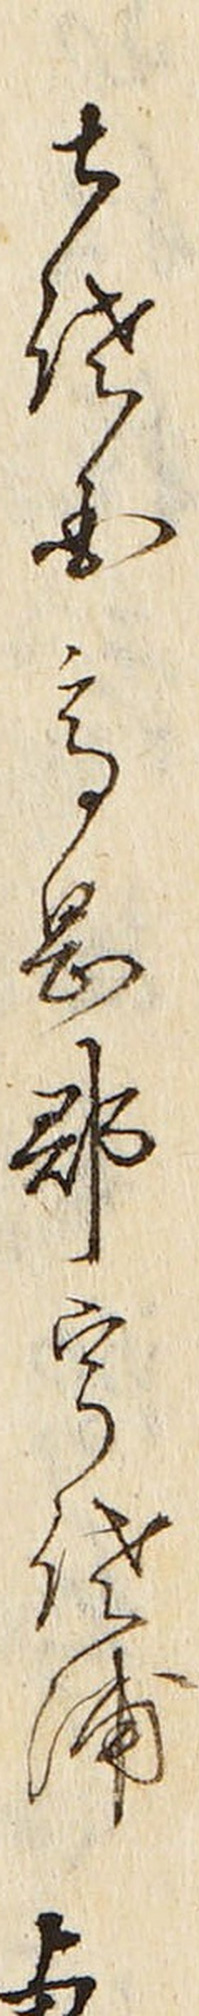土佐国高岡郡宇佐浦
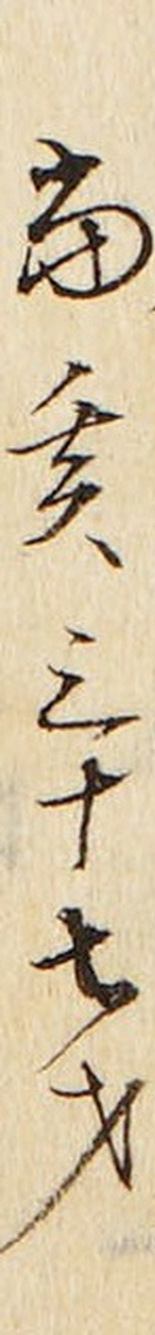当亥三十七才
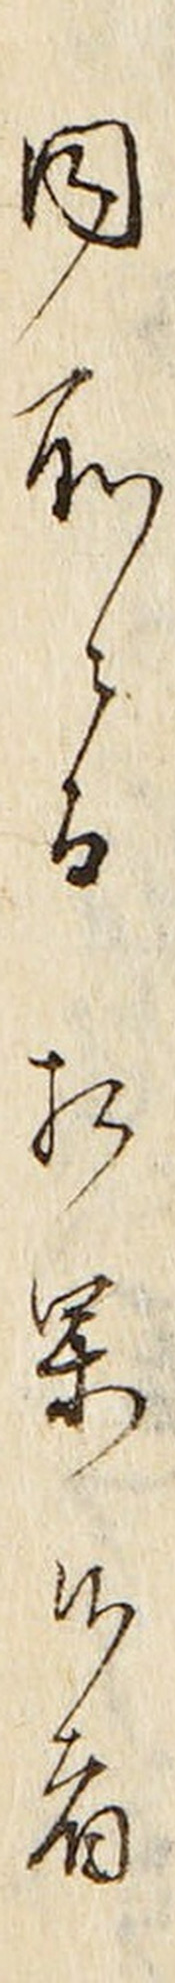同所に而相果候者
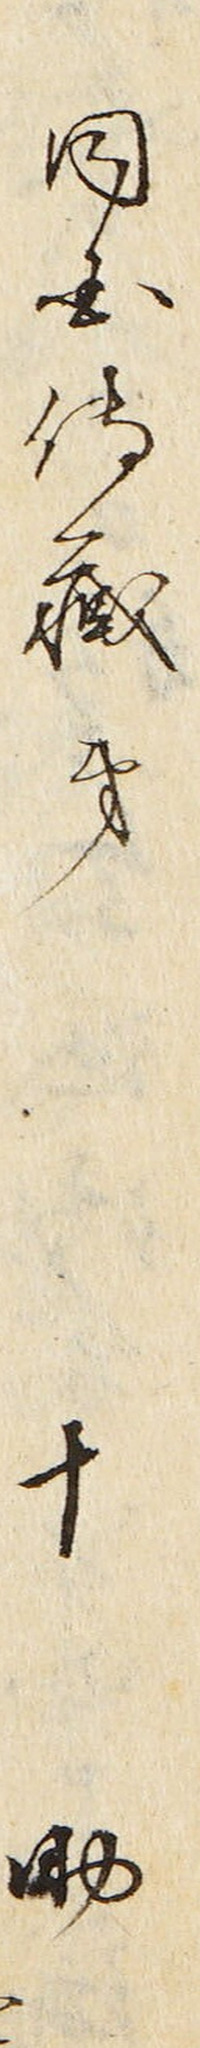同国伝蔵弟十助
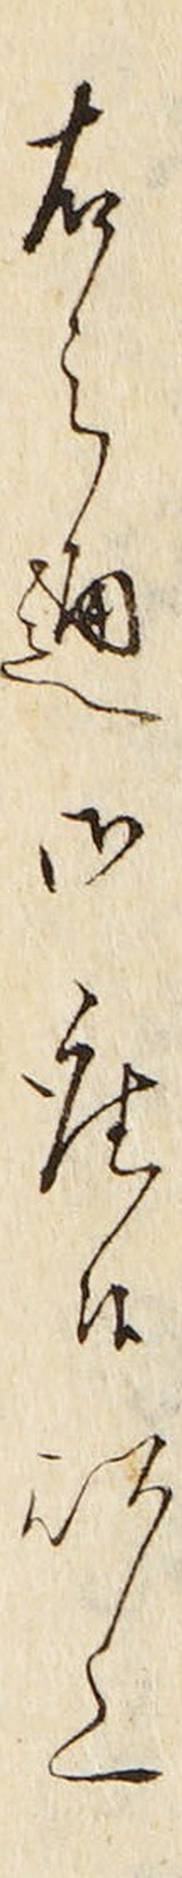右之通御座候以上
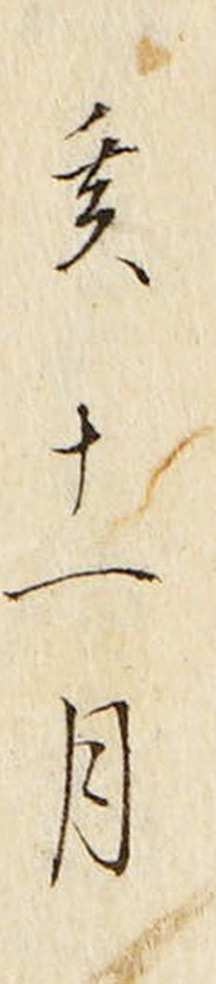亥十一月
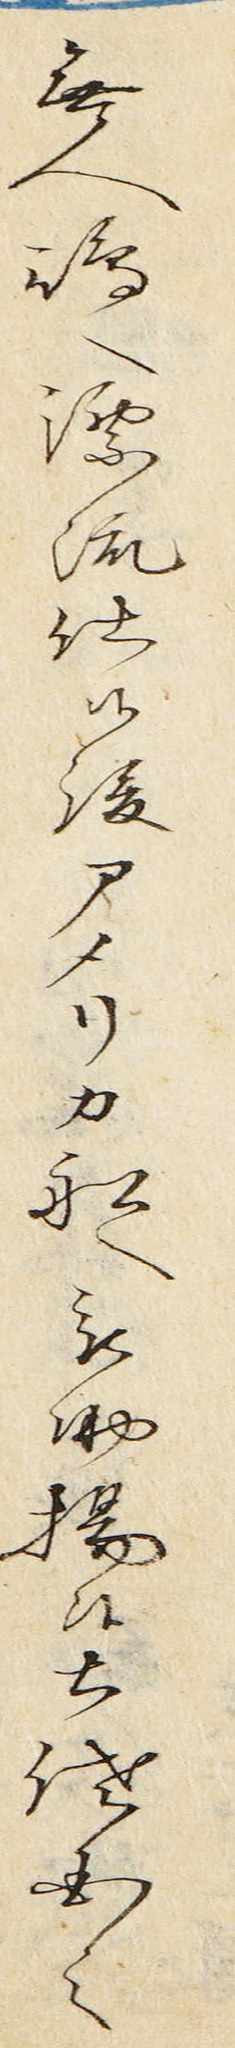無人嶋へ漂流仕候後アメリカ船へ被助揚候土佐国之
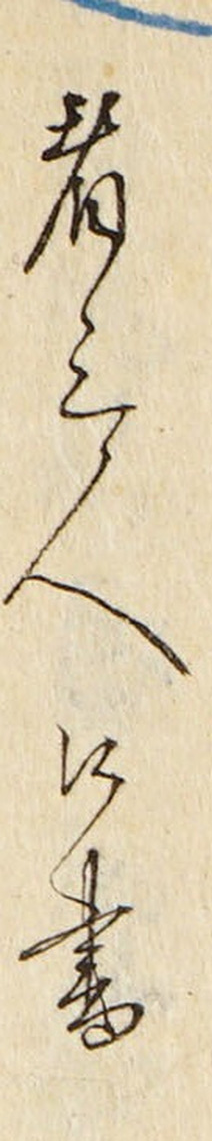者三人口書
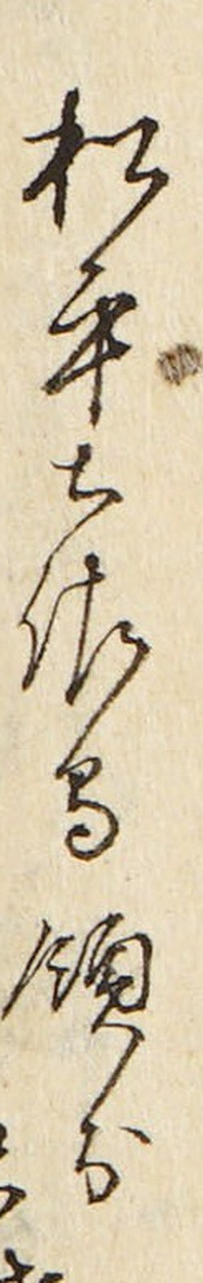松平土佐守領分
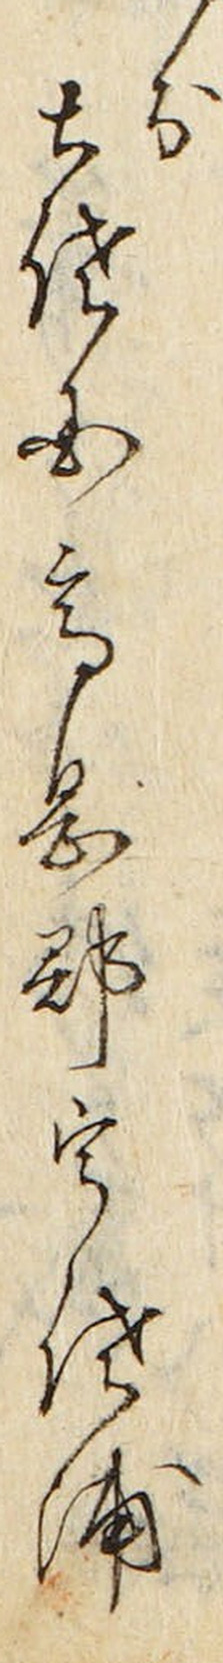土佐国高岡郡宇佐浦

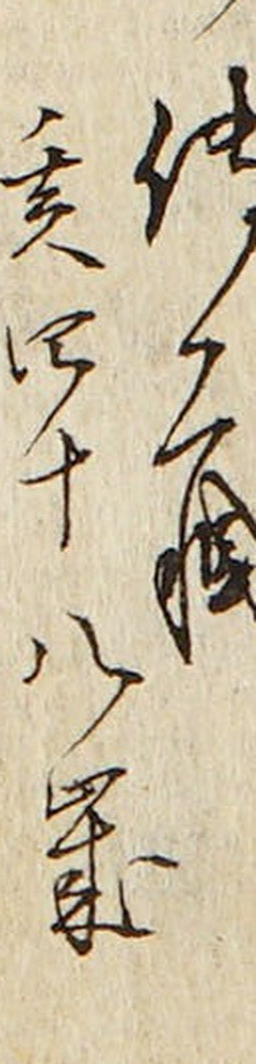亥四十八歳
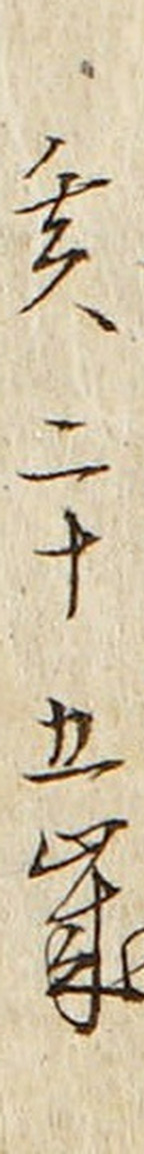亥二十五歳
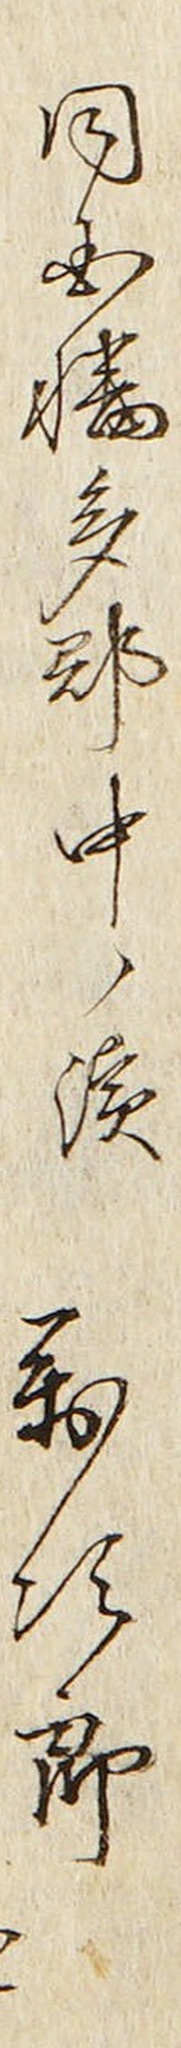同宗同国幡多郡中ノ浜万次郎
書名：土佐中浜万次郎漂流記
